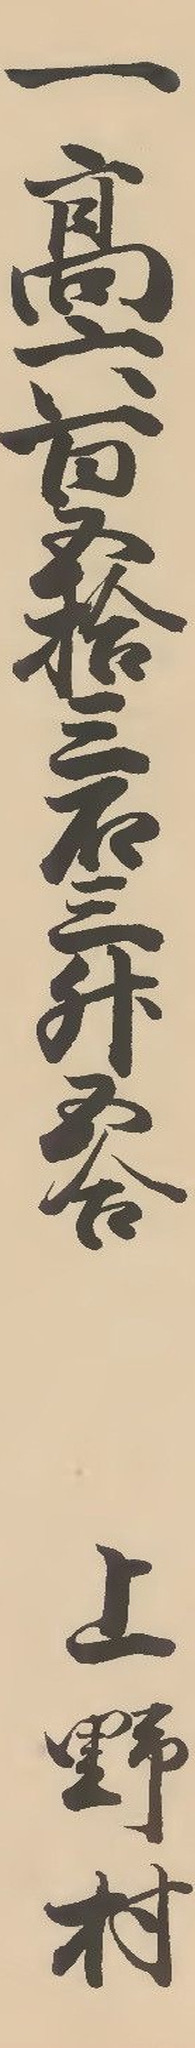一髙六百五拾三石三升五合上野村
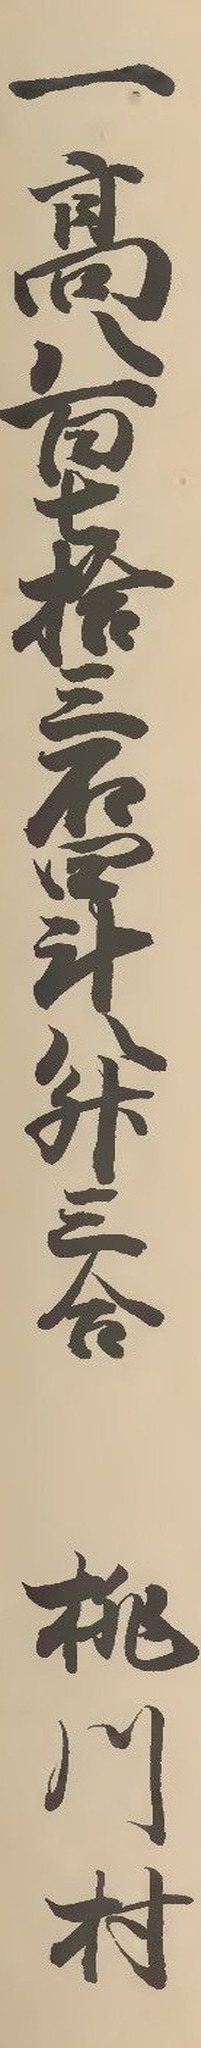一髙八百七拾三石四斗八升三合桃川村
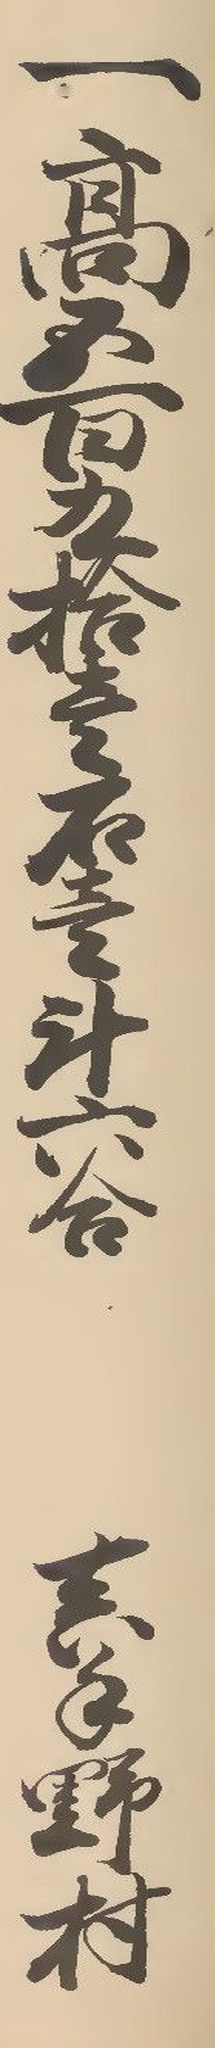一髙五百九拾壱石壱斗六合真手野村
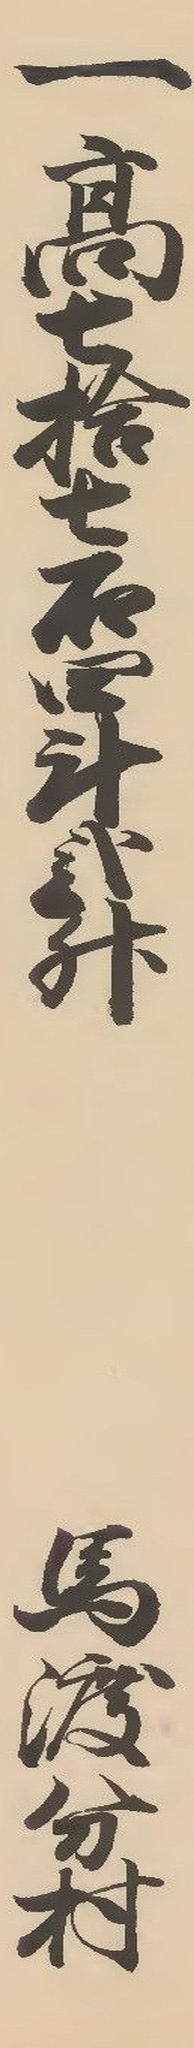一髙七拾七石四斗弐升馬渡分村
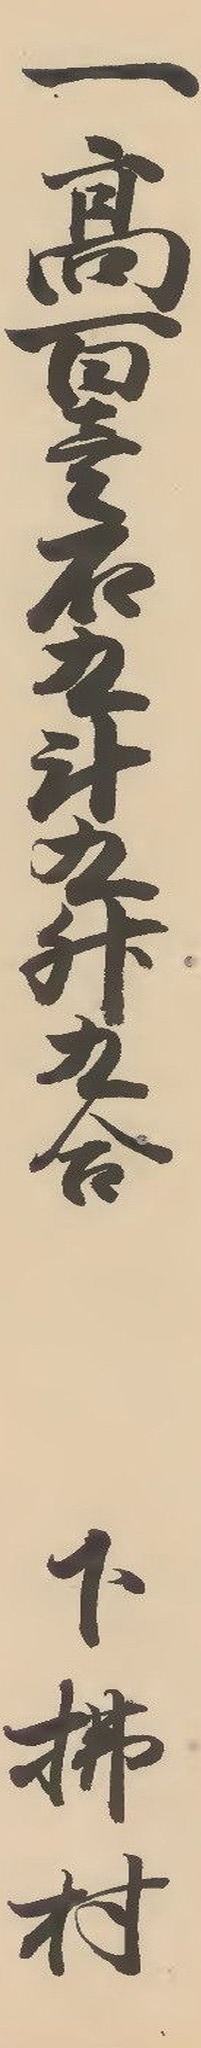一髙百壱石九斗九升九合下村
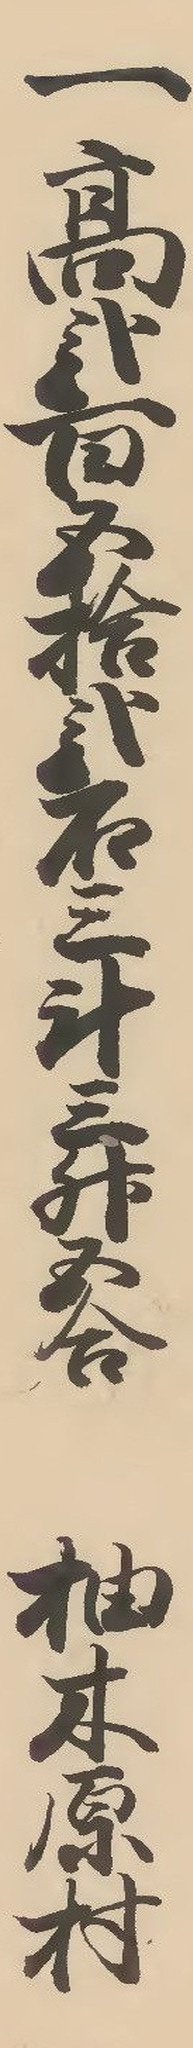一髙弐百五拾弐石三斗三升五合柚木原村

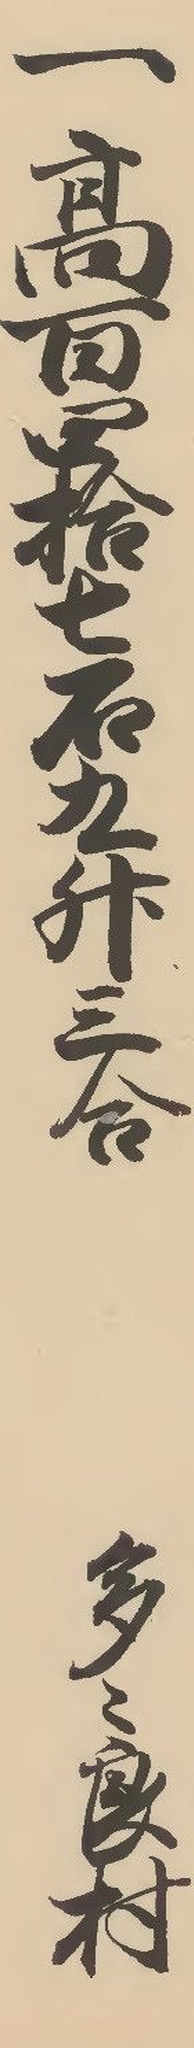一髙百四拾七石九升三合多々良村
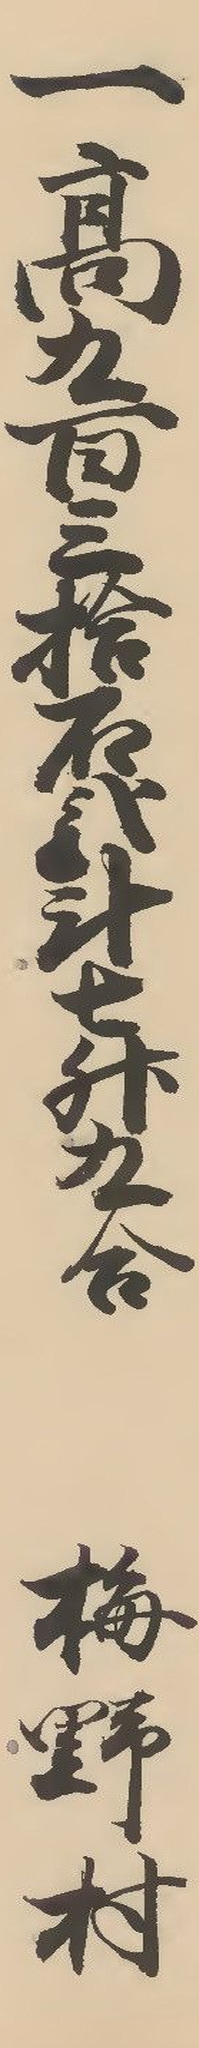一髙九百三拾石弐斗七升九合梅野村
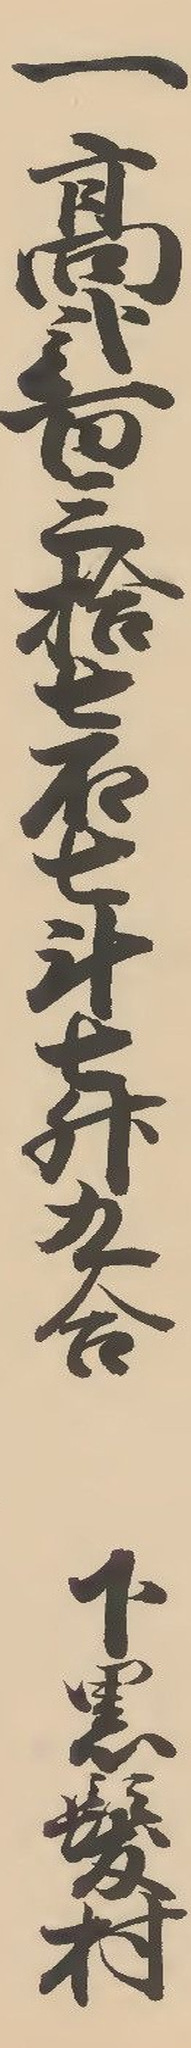一髙弐百三拾七石七斗七升九合下黑髪村
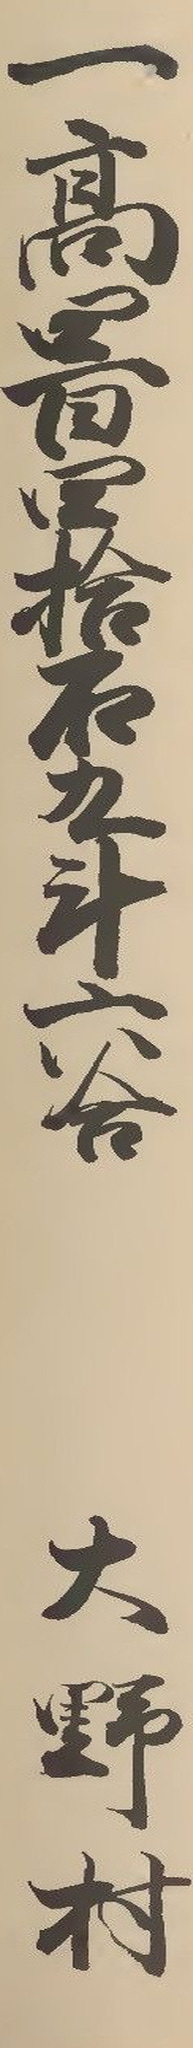一髙四百四拾石九斗六合大野村
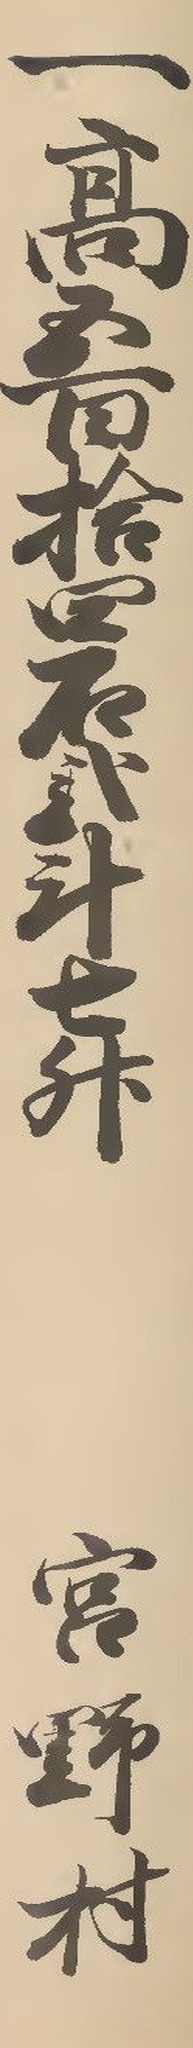一髙五百拾四石弐斗七升宮野村
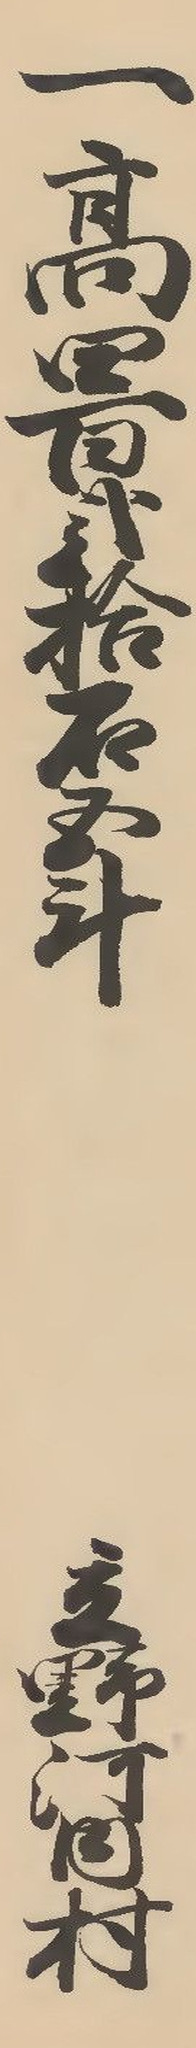一髙四百弐拾石五斗立野河内村
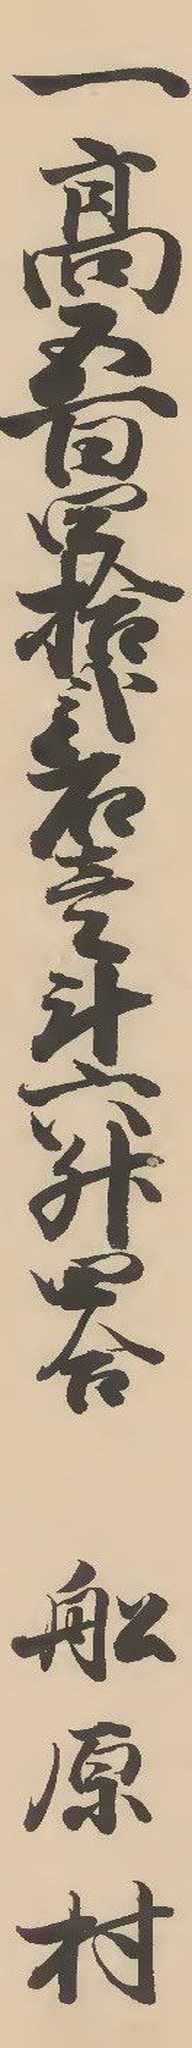一髙五百四拾弐石壱斗六升四合舩原村
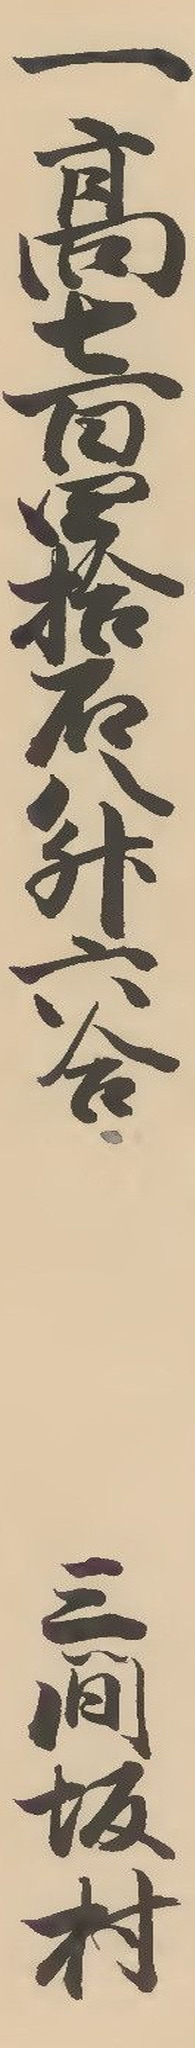一髙七百四拾石八升六合三間坂村

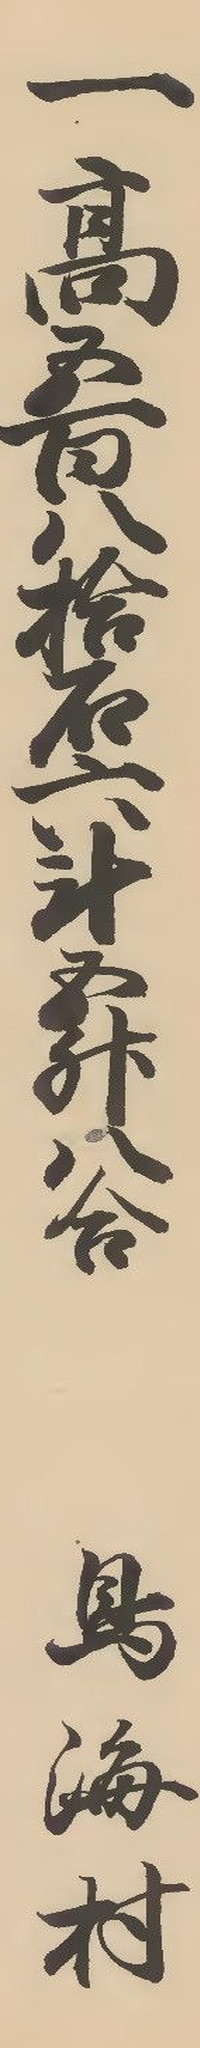一髙五百八拾石六斗五升八合鳥海村
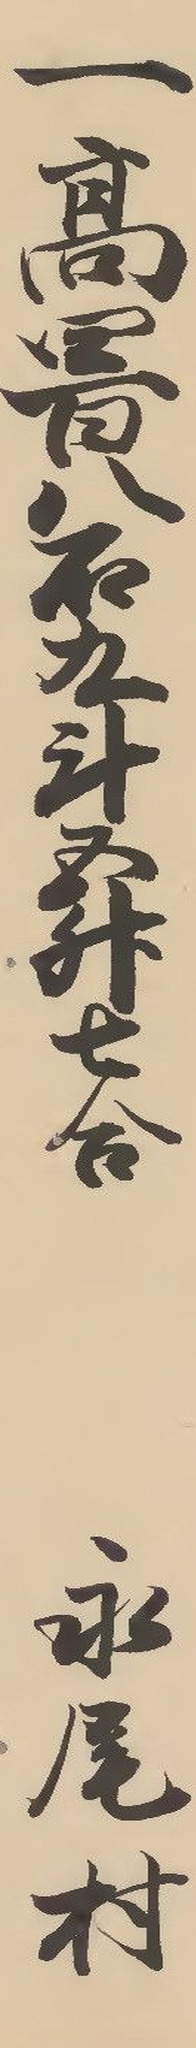一髙四百八石九斗五升七合永尾村
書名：肥前国郷帳
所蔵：国立公文書館 National Archives of Japan
